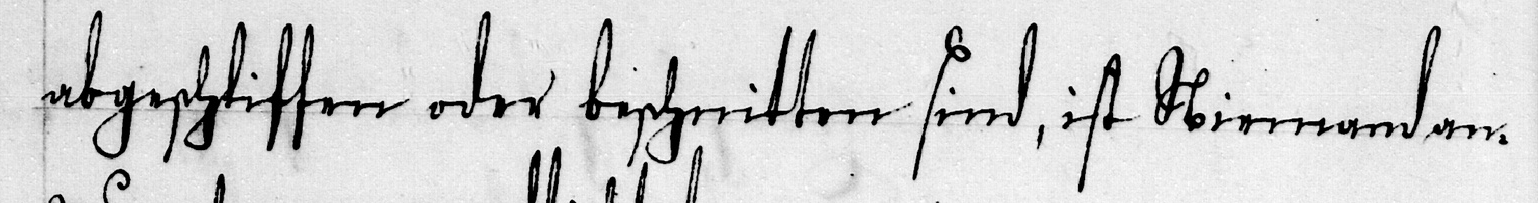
bgeschliffen oder beschnitten sind, ist Niemand an¬
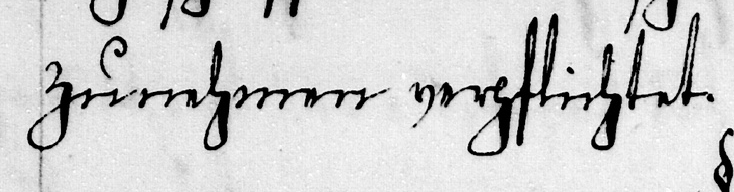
zunehmen verpflichtet.
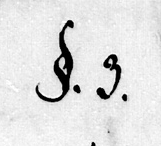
§. 3.
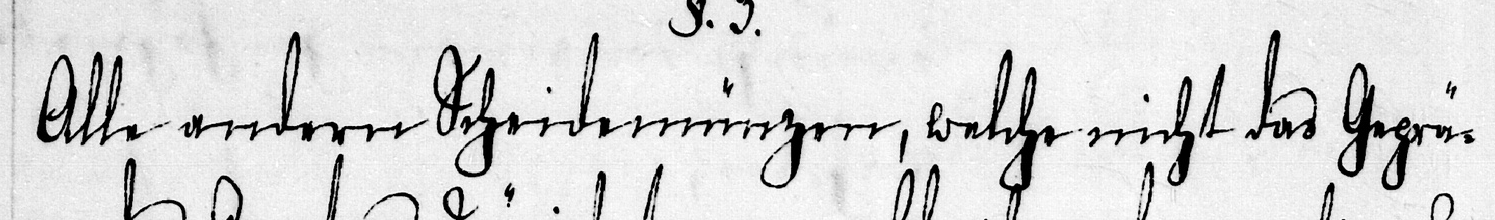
Alle andern Scheidemünzen, welche nicht das Geprä¬
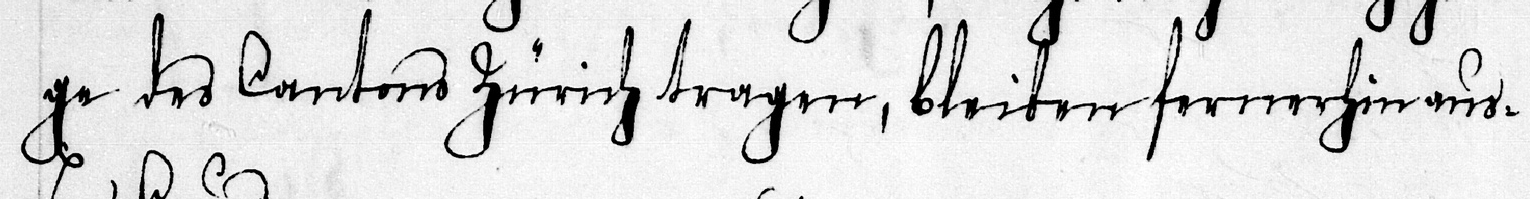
ge des Cantons Zürich tragen, bleiben fernerhin au¬
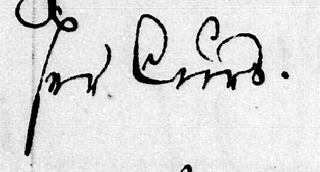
ßer Curs.
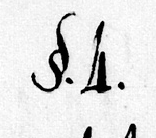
§. 4.
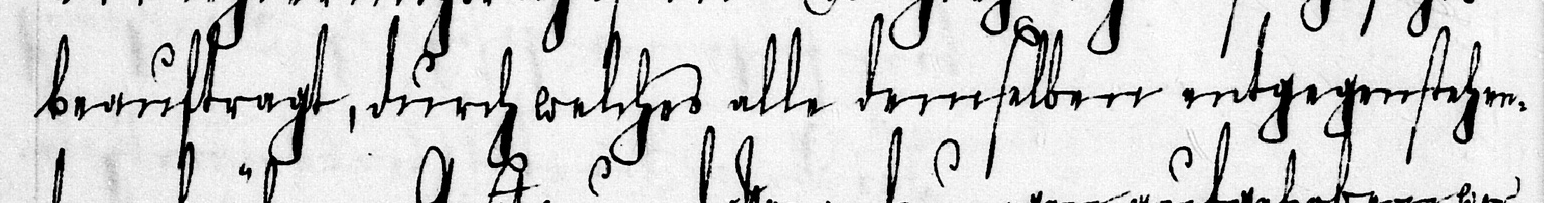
beauftragt, durch welches alle demselben entgegenstehen¬
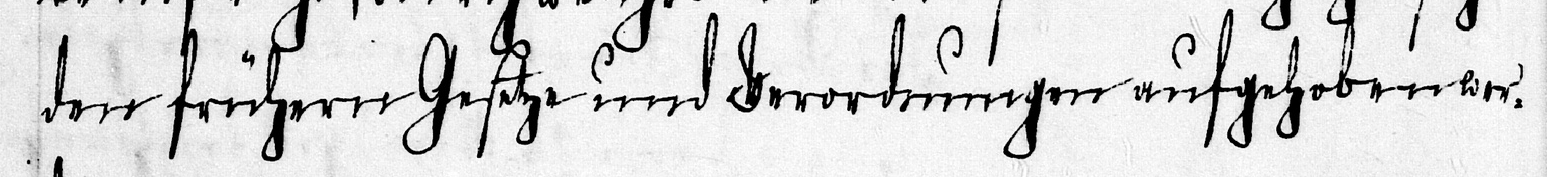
den frühern Gesetze und Verordnungen aufgehoben wer¬
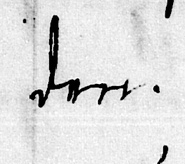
den.
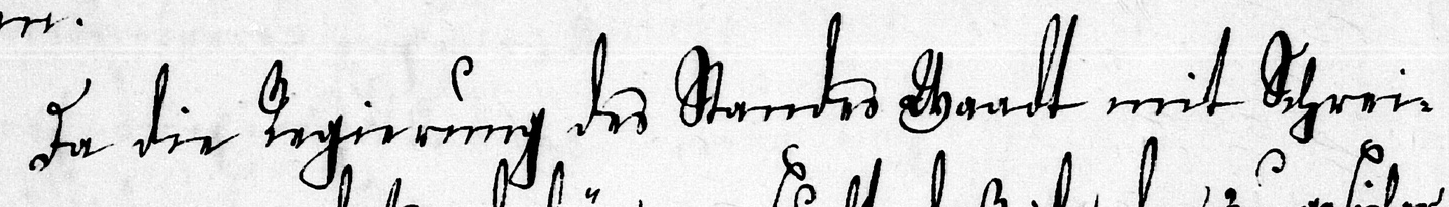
Da die Regierung des Standes Waadt mit Schrei¬
